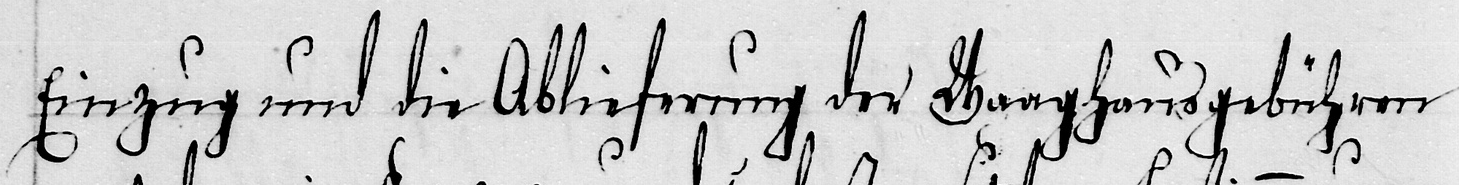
Einzug und die Ablieferung der Waaghausgebühren
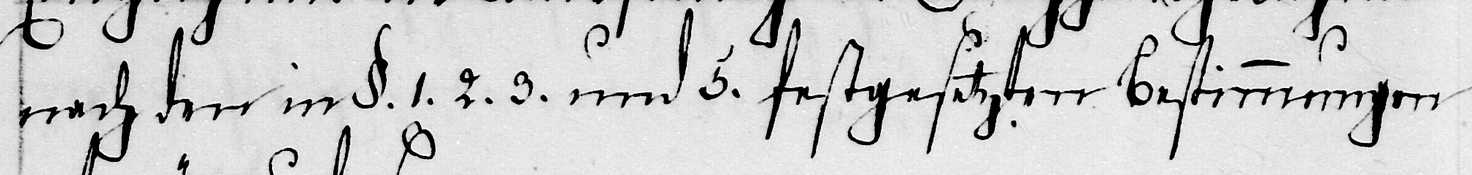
nach den in §. 1.[,] 2.[,] 3. und 5. festgesetzten Bestimmungen
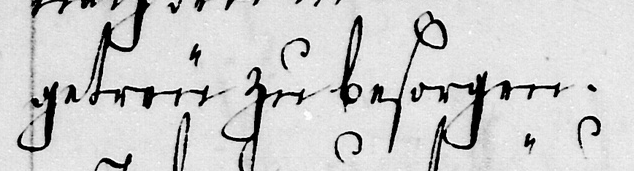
getreu zu besorgen.
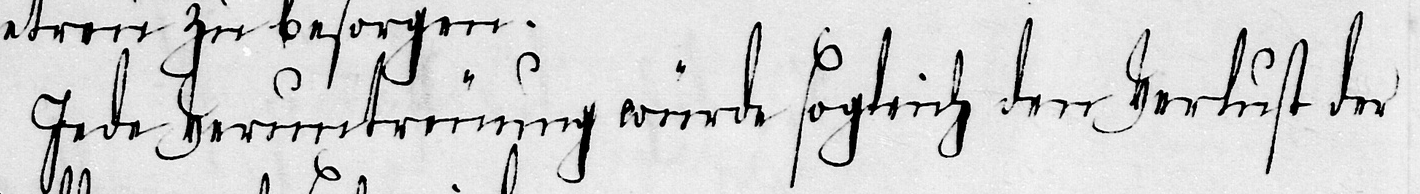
Jede Veruntreuung würde sogleich den Verlust der
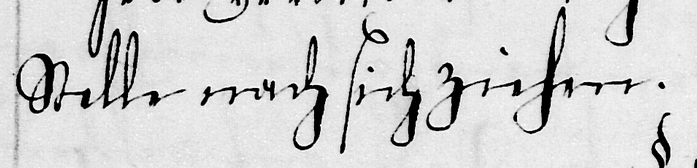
Stelle nach sich ziehen.
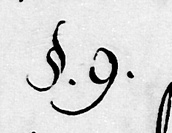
§. 9.
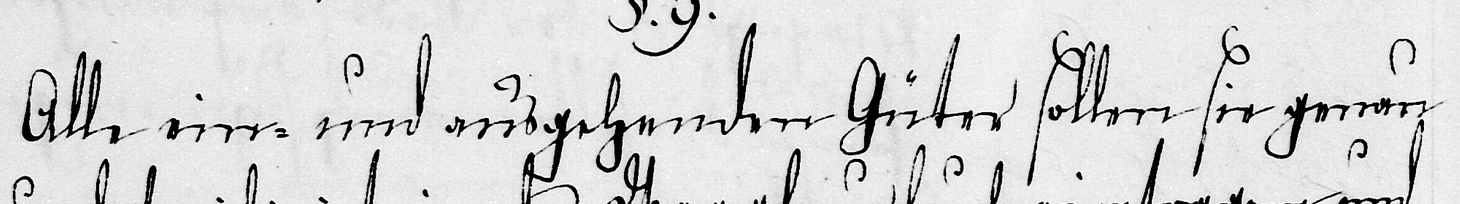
Alle ein- und ausgehenden Güter sollen sie genau
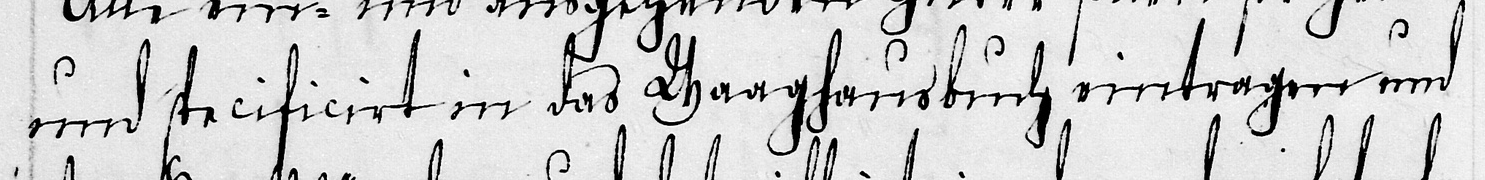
und specificirt in das Waaghausbuch eintragen und
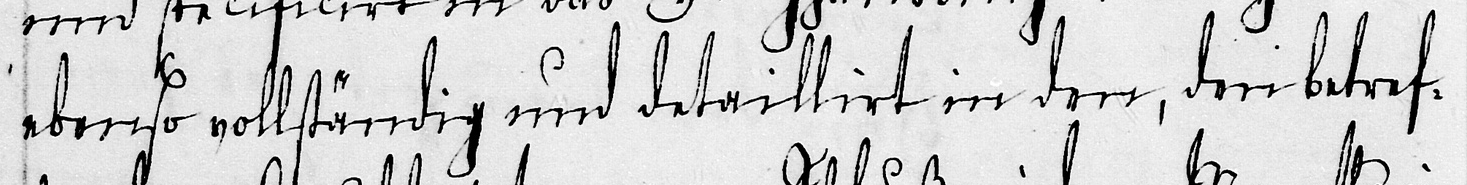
ebenso vollständig und detaillirt in den, den betref¬
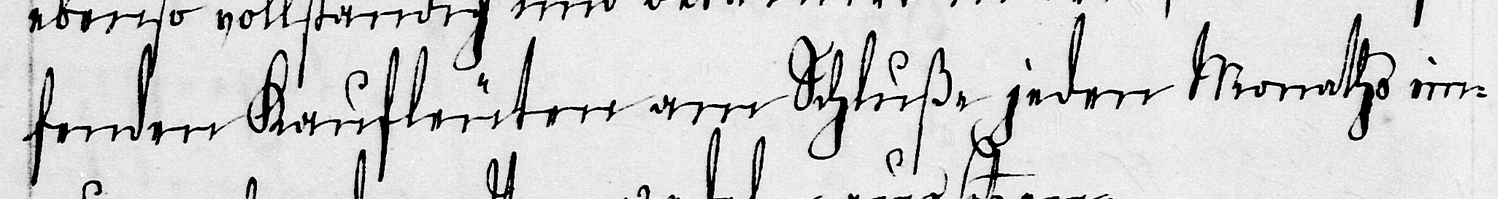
fenden Kaufleuten am Schluße jeden Monaths ei¬
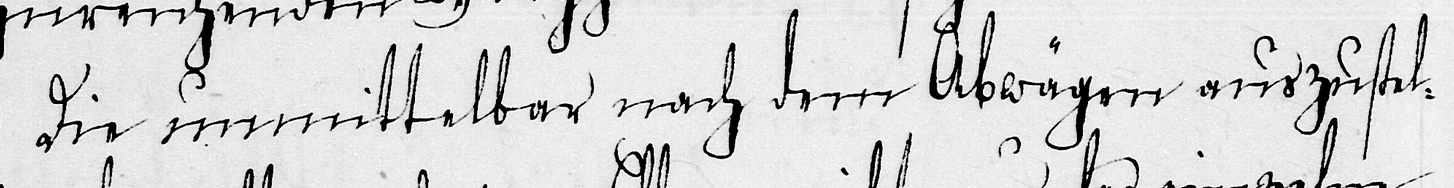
Die unmittelbar nach dem Abwägen auszustel¬
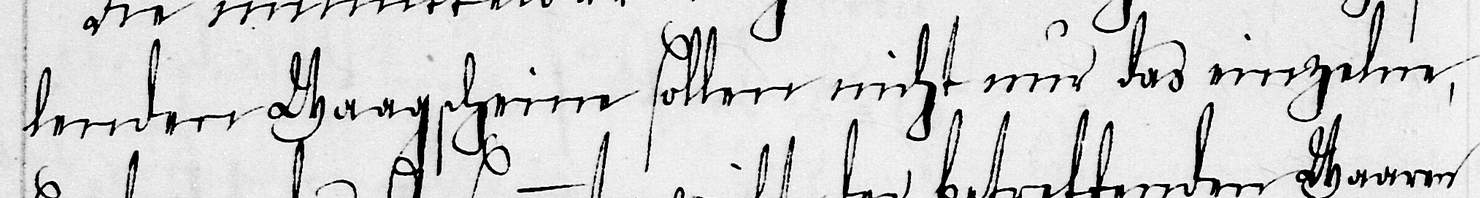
lenden Waagscheine sollen nicht nur das einzelne,
